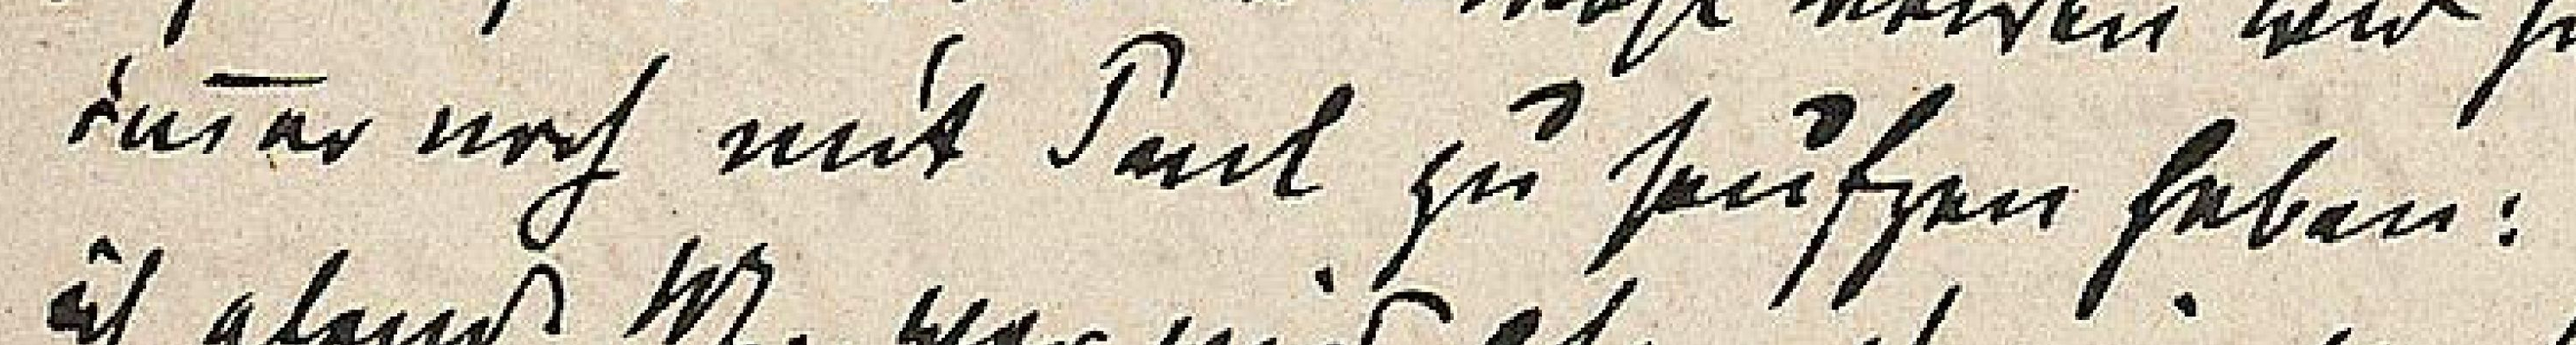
imer noch mit Paul zu seufzen haben:
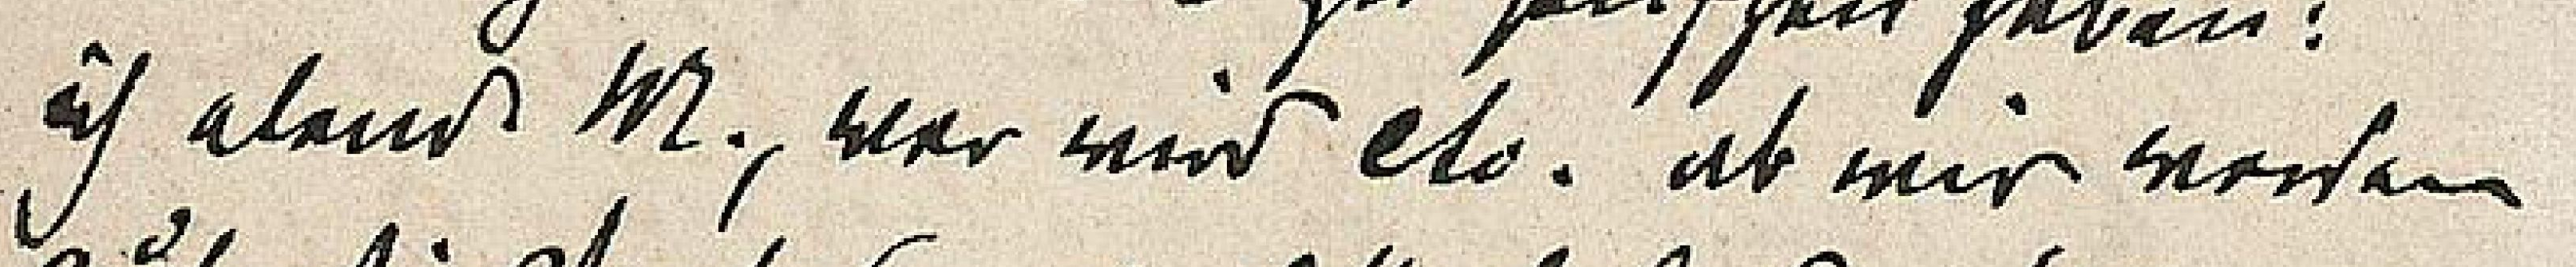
ich elend M., wer wird etc. ab wir werden
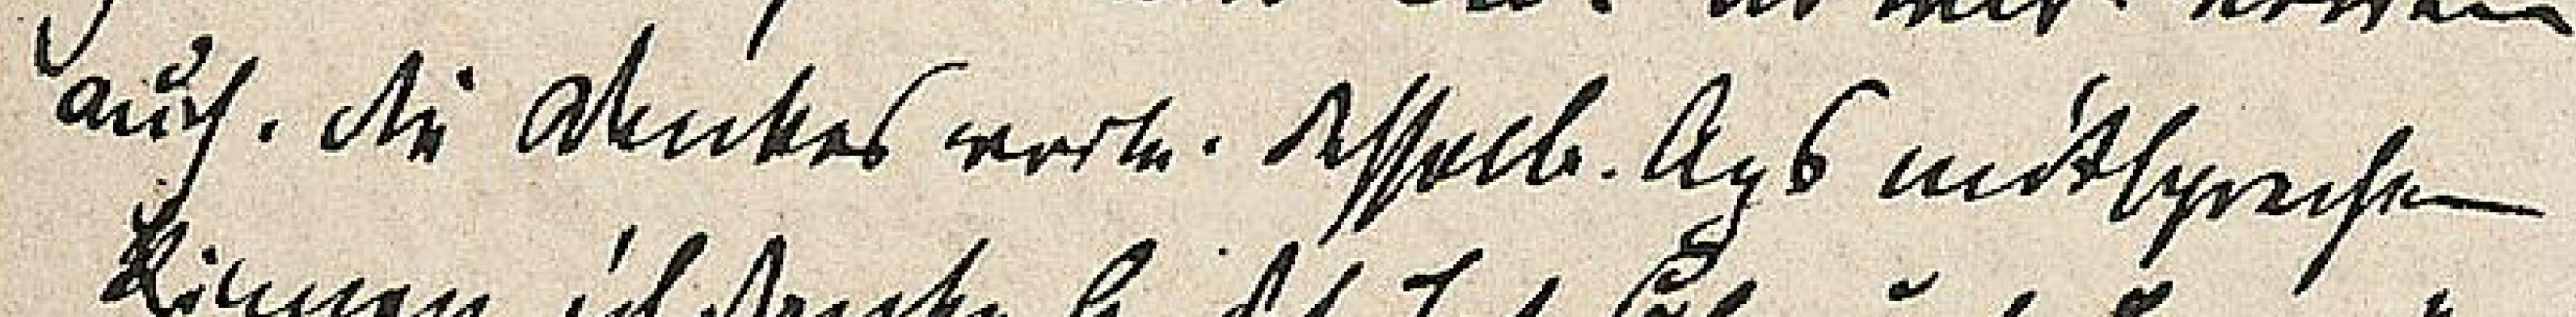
auch. die Dankesworte. desselb. Aps mitsprechen
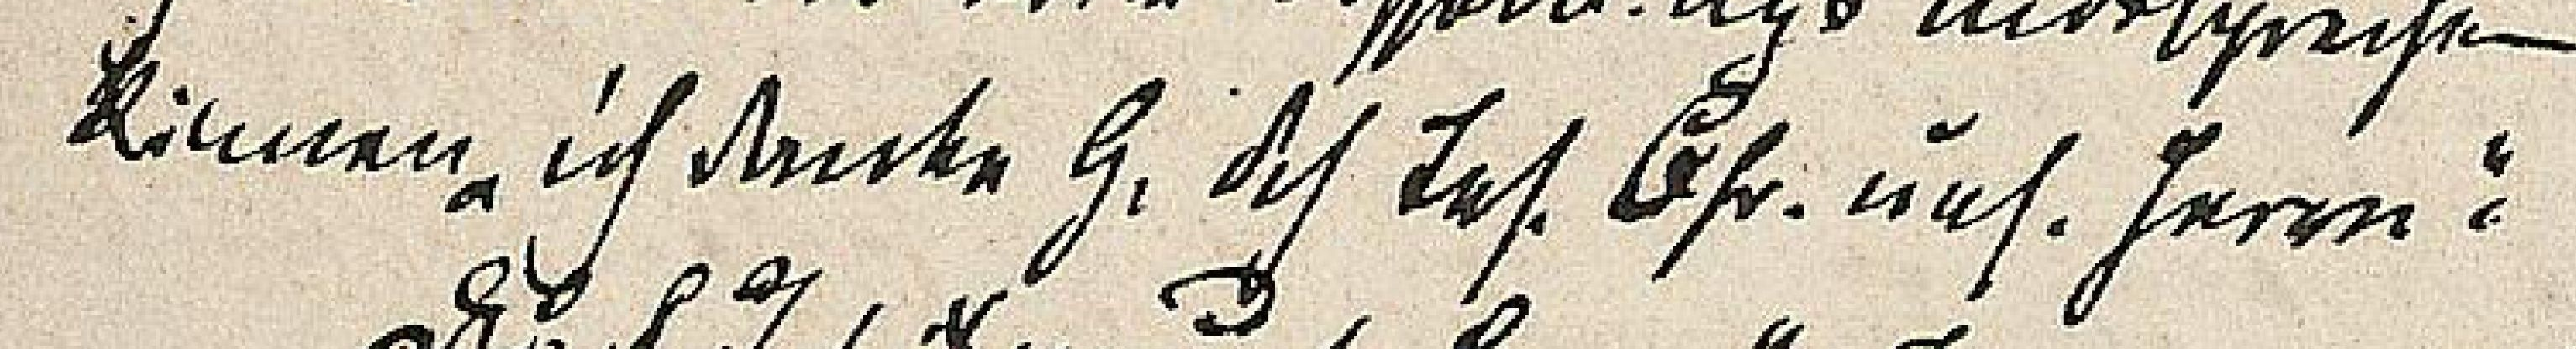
können "ich danke G. dch Jes. Chr. uns. Herrn."
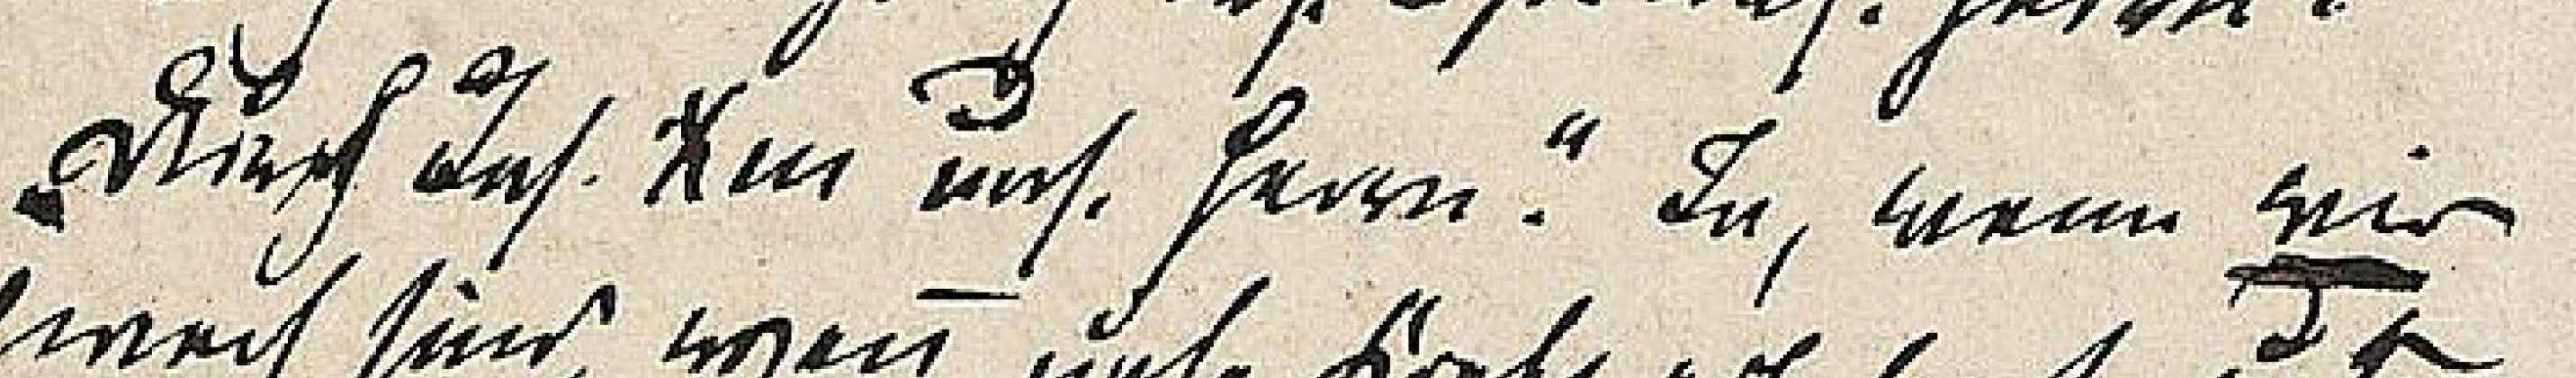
"Durch Jes. Χm. uns Herrn!" Ja, wenn wir
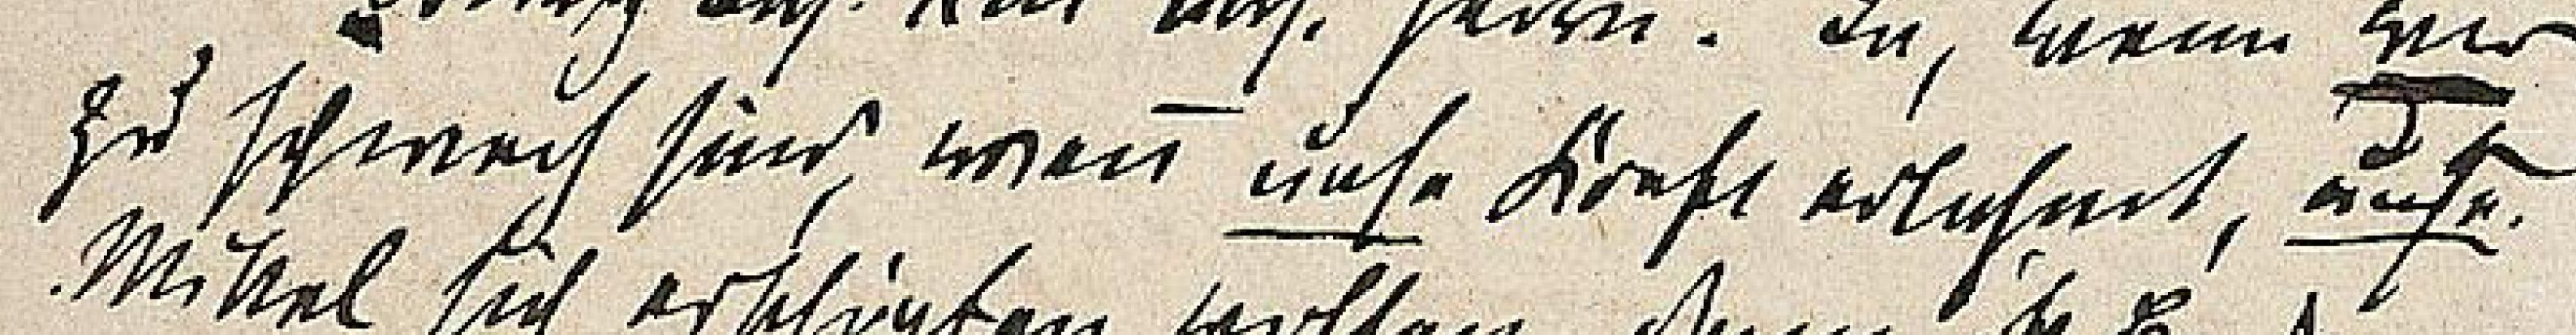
zu schwach sind, wen unser Kraft erlahmt, unsr.
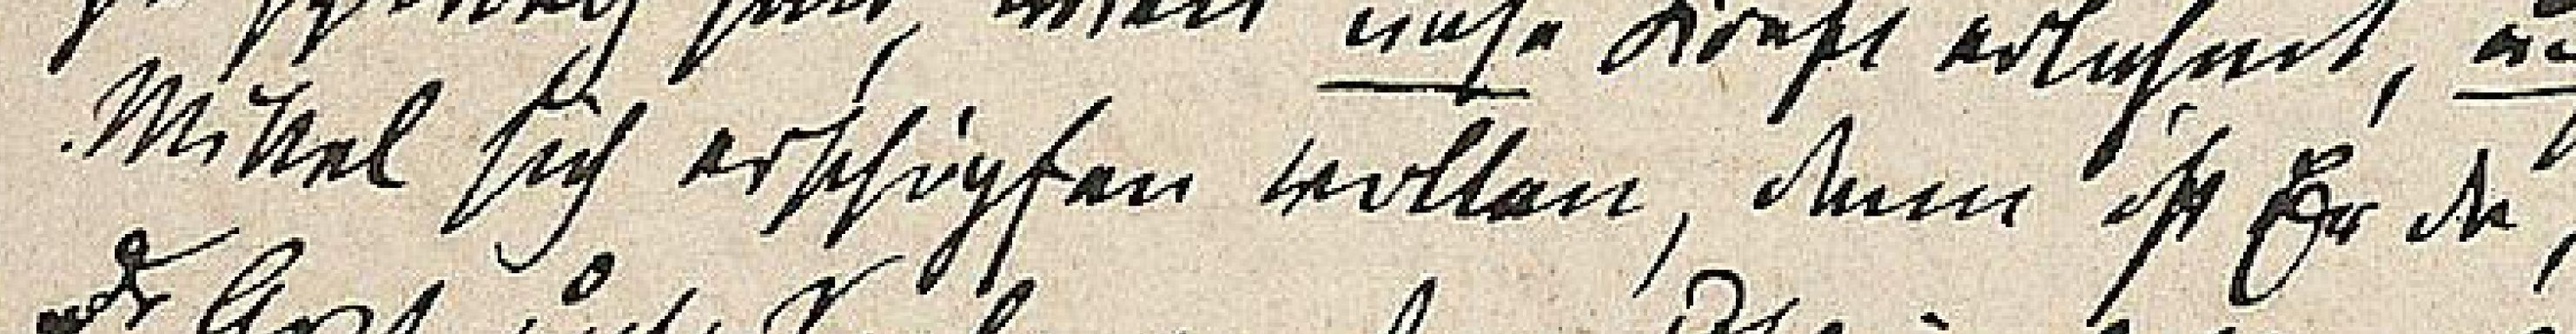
Mittel sich erschöpfen wollten, dann ist Er da,
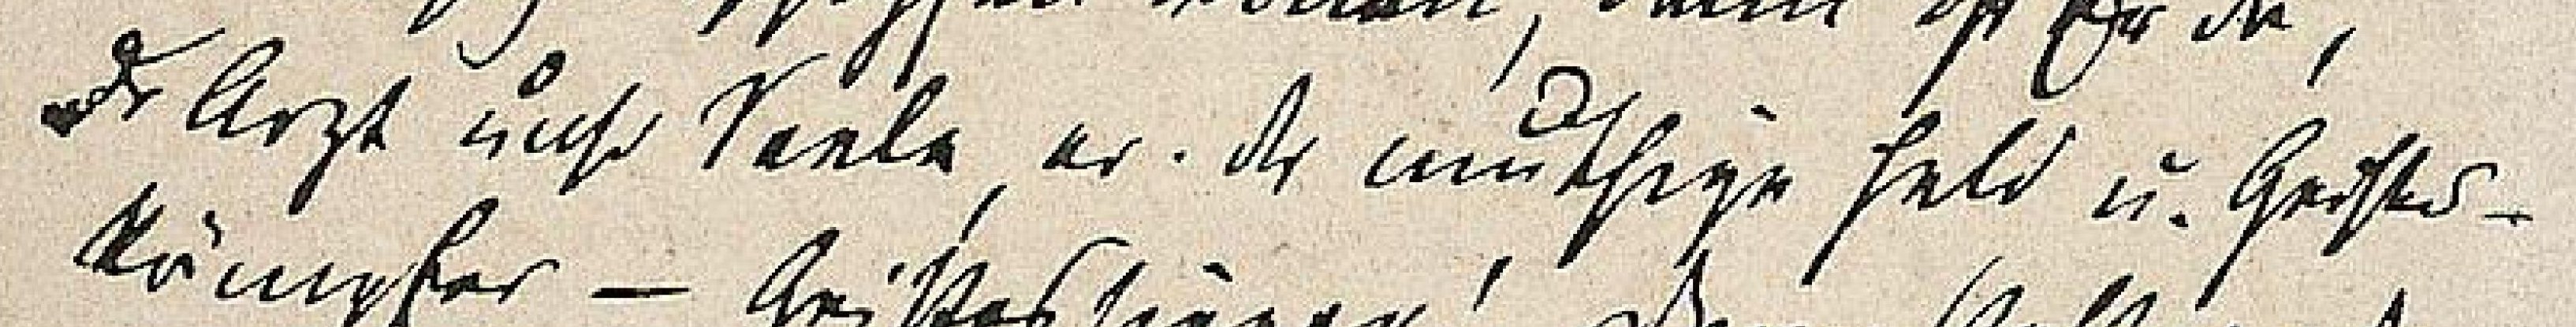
dr Arzt uns Seele, er der muthige Held u. Geistes¬
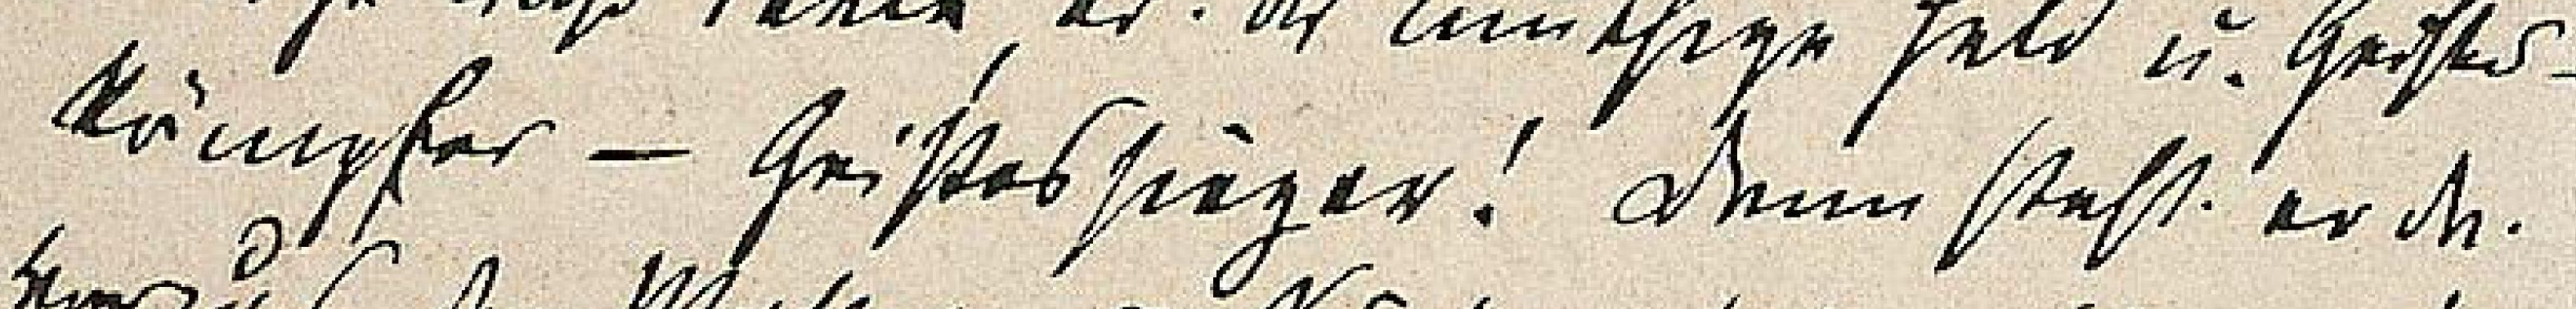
kämpfer _ Geistessieger! Dann steht er da.
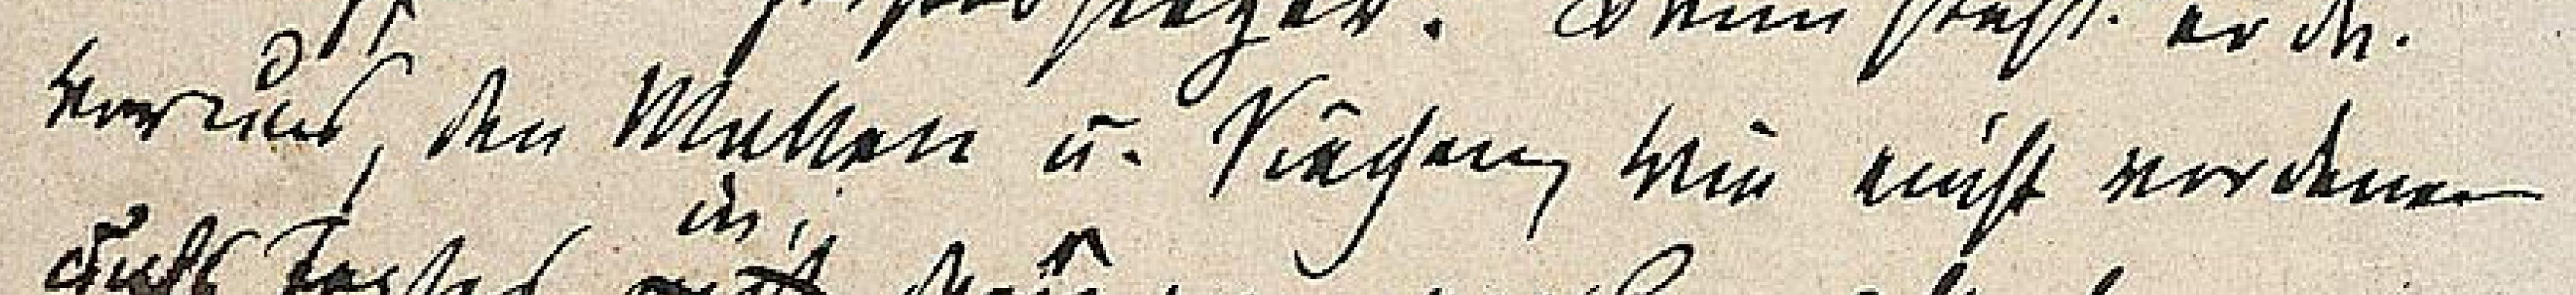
vor uns, den Matten, u. Siechen, wie einst vor denen
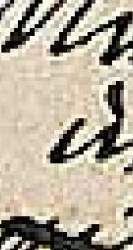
in
